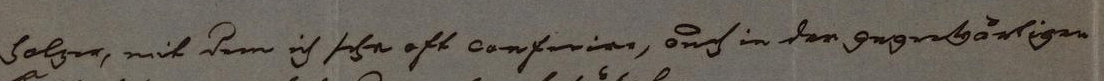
holzer, mit dem ich sehr oft conferire, auch in der gegenwärtigen
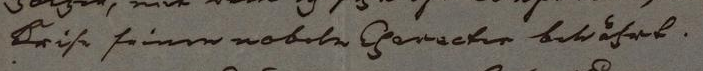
Krise seinen nobeln Character bewährt.
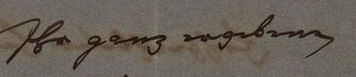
Ihr ganz ergebener
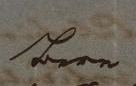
Bern
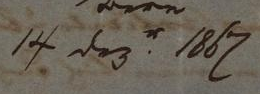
14 Dezr 1867
